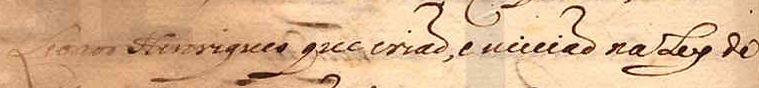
Leonor Henriques que criaõ, e uiuiaõ na Ley de
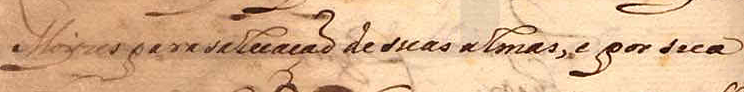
Moyzes pera saluaçaõ de suas almas, e por sua
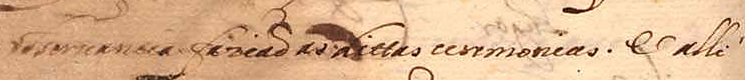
observancia faziaõ as dittas ceremonias. E alli
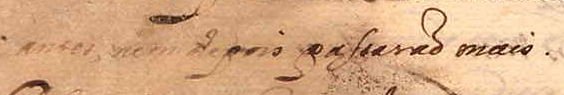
antes nem depois passaraõ mais.
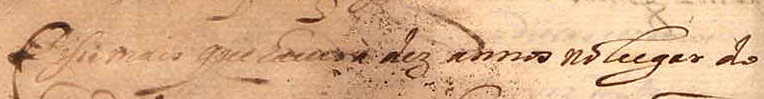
Disse mais que hauerà dez annos no lugar do
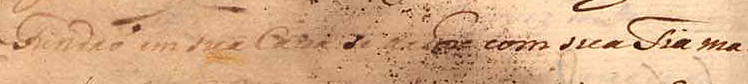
Fundaõ em sua caza se achou com sua Tia ma
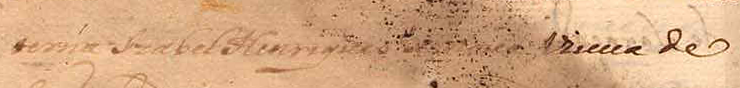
terna Izabel Henriques _ viuua de
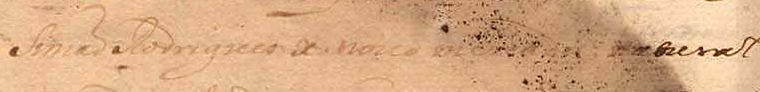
Simaõ Rodrigues x. nouo mercador natural
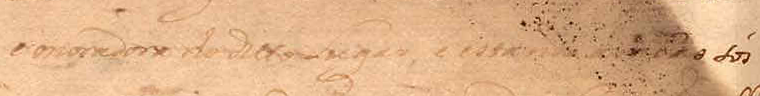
e morador do ditto Lugar, e estando ambos sós
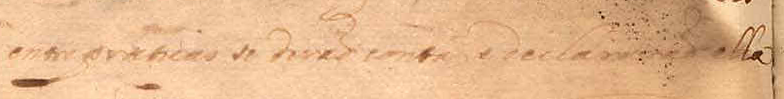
entre praticas se deraõ conta e declararaõ ella
